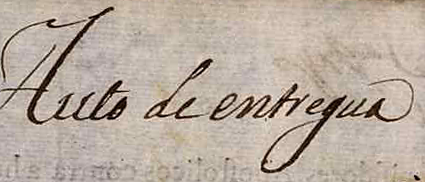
Auto de entregua
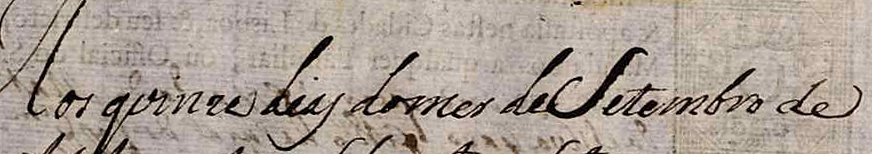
Aos quinze dias do mes de Setembro de
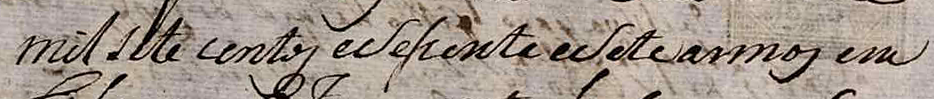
mil setecentos e sessenta e sete annos em
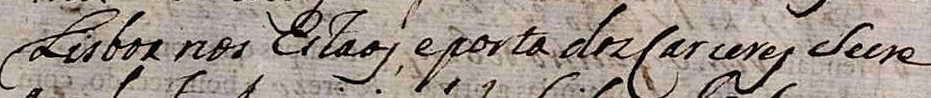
Lisboa nos Estaos, e porta dos Carceres Secre
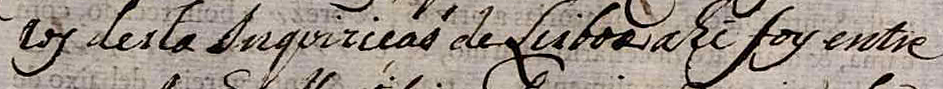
tos desta Inquiziçaõ de Lisboa ahi foy entre
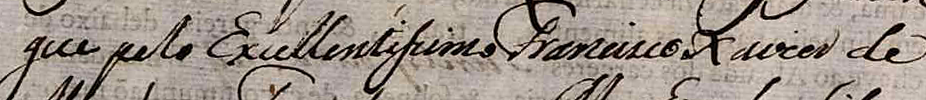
gue pelo Excellentissimo Francisco Xavier de
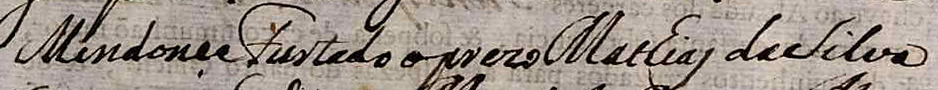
Mendonça Furtado o prezo Mathias da Silva
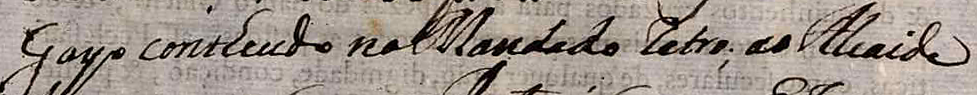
Gayo contheudo no Mandado Retro ao Alcaide
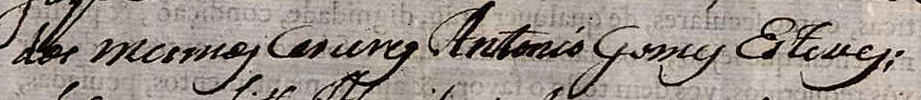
dos mesmos Carceres Antonio Gomes Esteves;
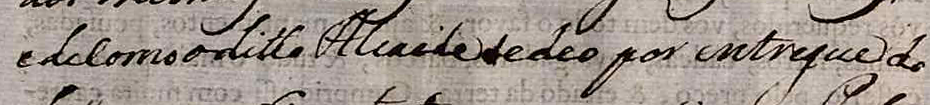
e de como o ditto Alcaide se deo por entregue do
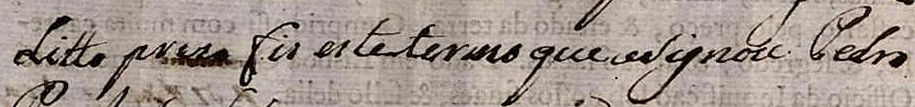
ditto prezo fis este termo que asignou Pedro
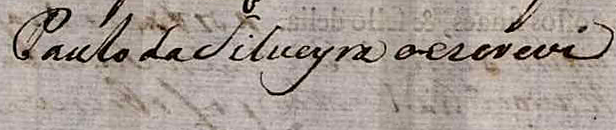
Paulo da Silueyra o escrevi
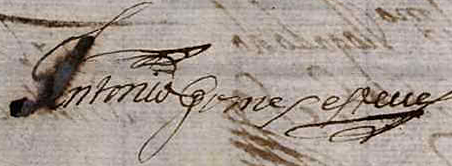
Antonio gomes esteues
